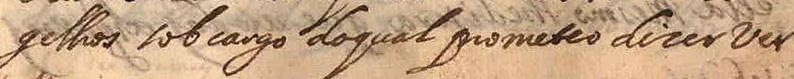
gelhos sob cargo do qual prometeo dizer ver
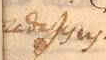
za de Jesus
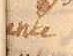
ente
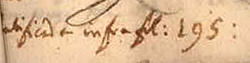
atificada infra fol: 195:
